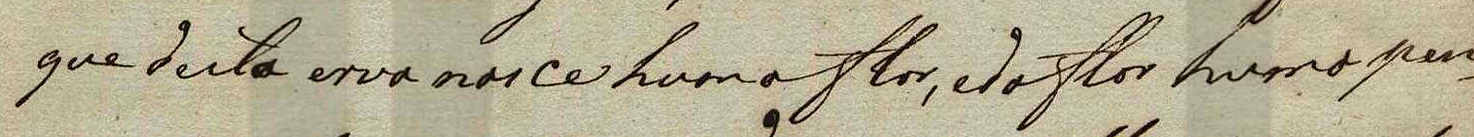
que desta erva nasce huma flor, e da flor huma pen
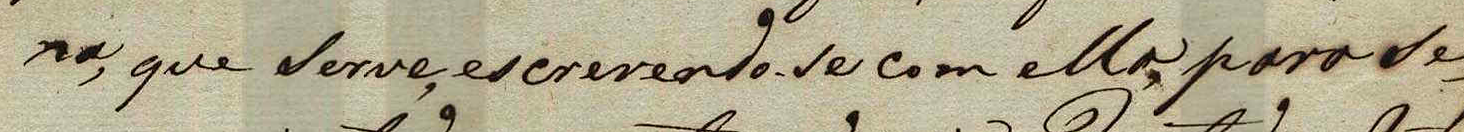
na, que serve, escrevendo-se com ella, para se
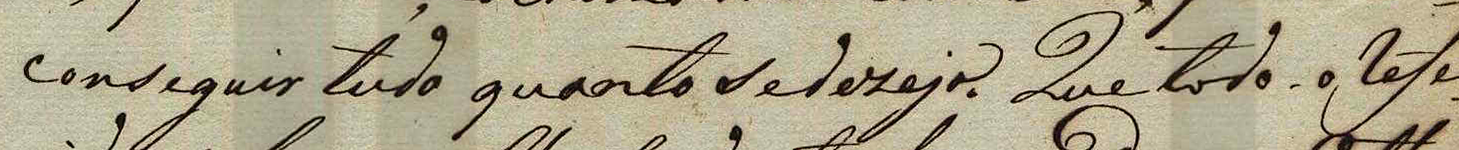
conseguir tudo quanto se dezeja. Que todo o refe
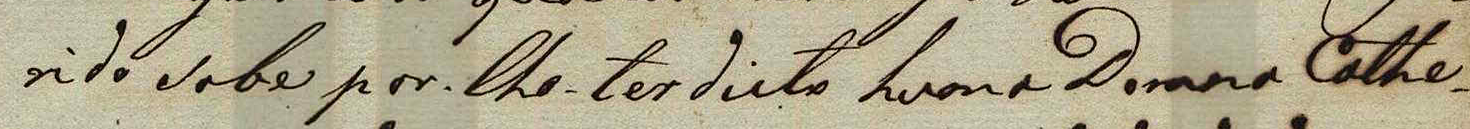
rido sabe por lho-ter dicto huma Domna Cathe
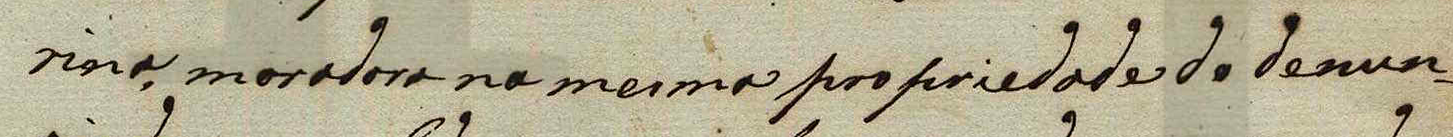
rina, moradora na mesma propriedade do denun
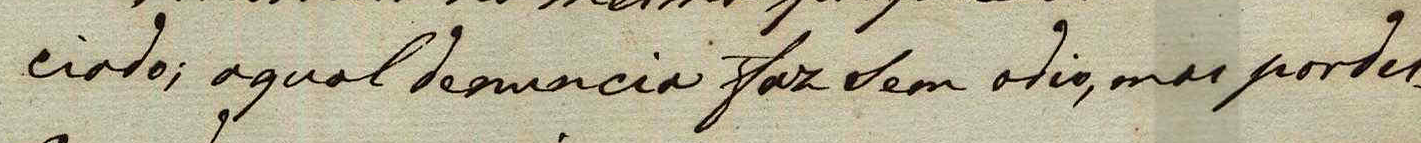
ciado; a qual denuncia faz sem odio, mas por des
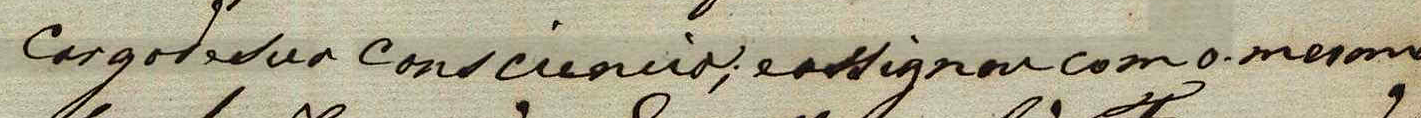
cargo de sua consciencia; e assignou com o mesmo
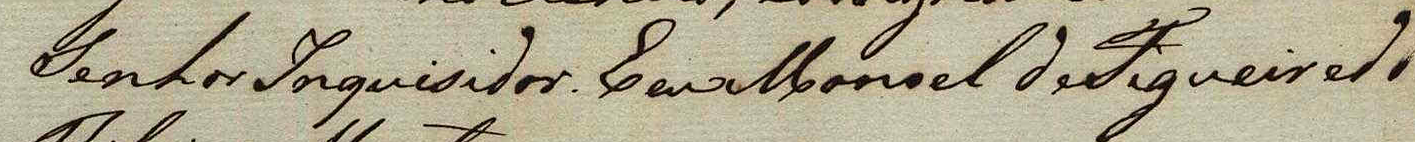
Senhor Inquisidor. E eu Manoel de Figueiredo
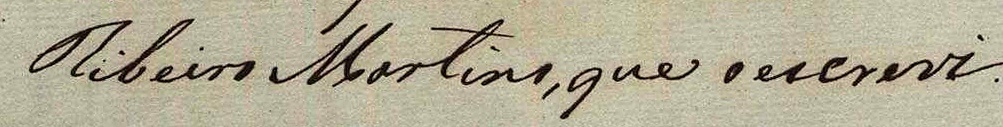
Ribeiro Martins, que o escrevi.
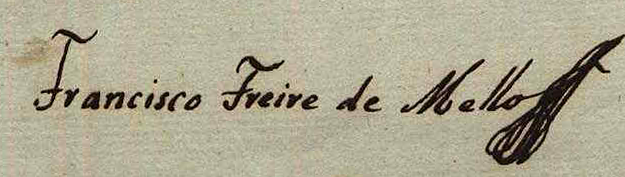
Francisco Freire de Mello
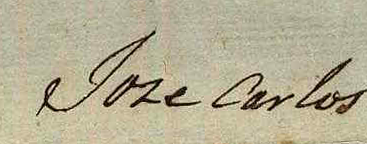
Ioze Carlos
